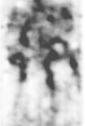與
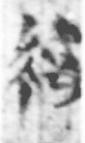紫
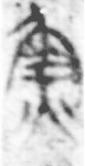魚
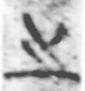之
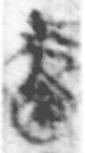○（箙）
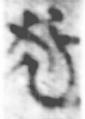狐
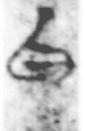白
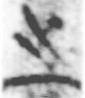之
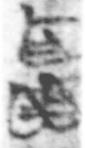聶（攝）
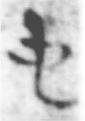屯
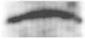一
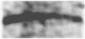一
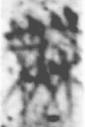無
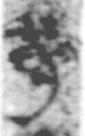革
